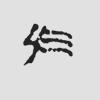於
